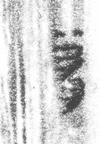實
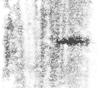一
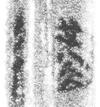○（黸）
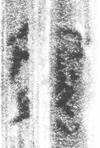緅
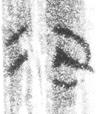衣
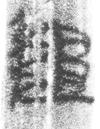○（錦）
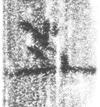之
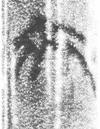夾
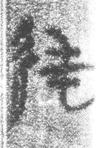純
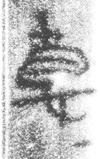惪（犆）
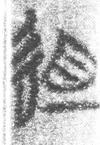組
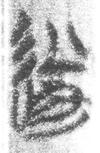○（繸）
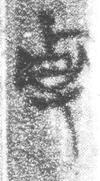弁（辮）
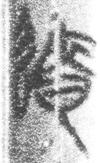○（繬）
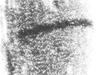一
